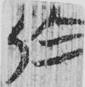於
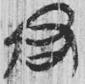君
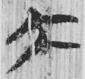大（太）
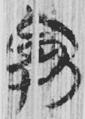○（宰）
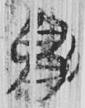{胃刀}（謂）
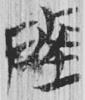陵
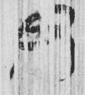尹
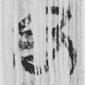君
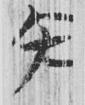內（入）
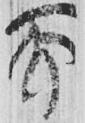而
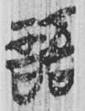語
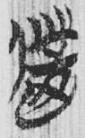○（僕）
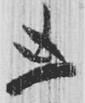之
